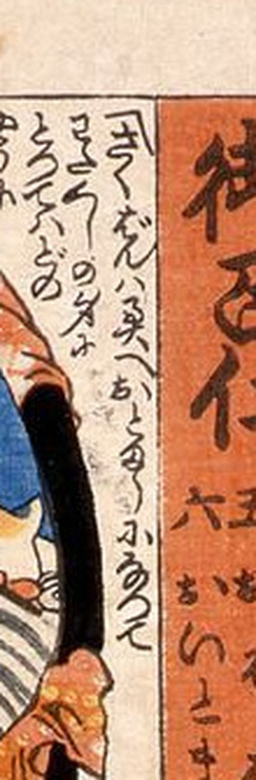〽さくばんは奥へおとまりになつて
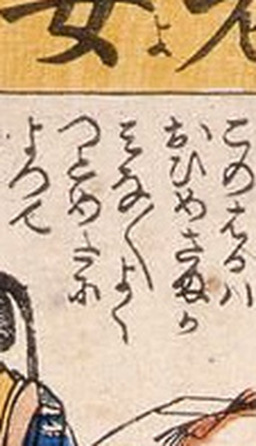みな〳〵よく
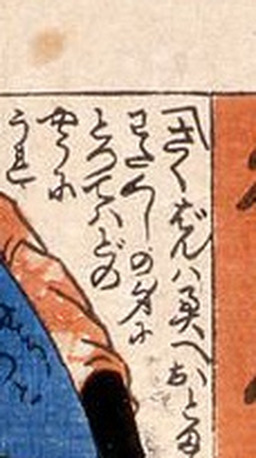とつてはどの
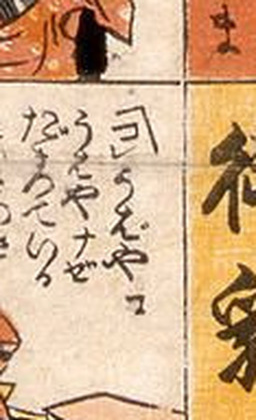〽コレうばや
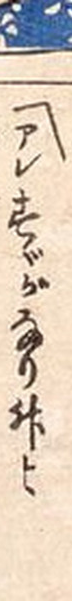〽アレすヾがなり升よ
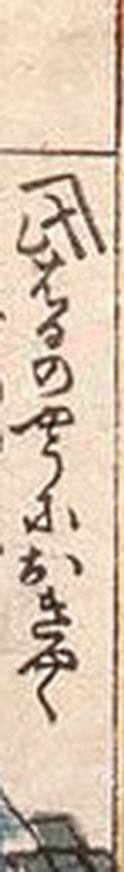〽此はるのやうにおきやく
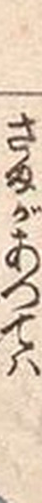さまがあつては
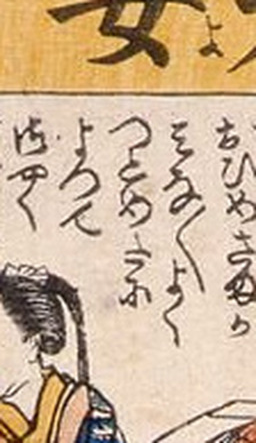つとめたに
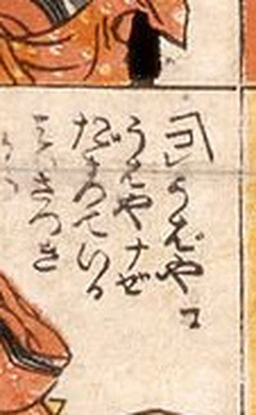うはやナゼ
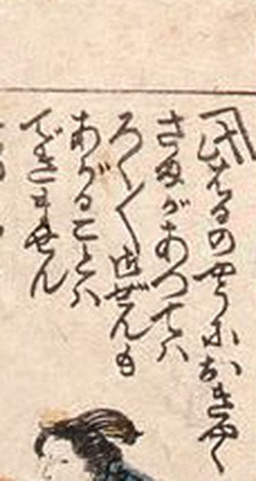ろく〳〵御ぜんも
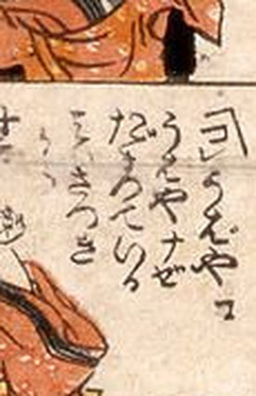だまつている
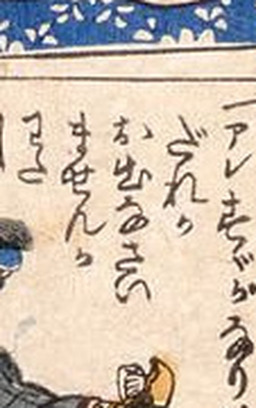お出なさい
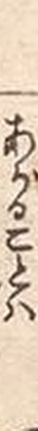あがることは
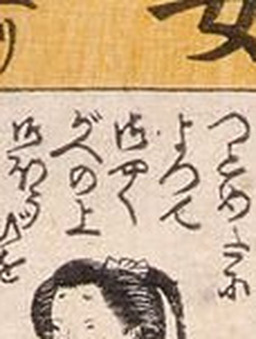御やく
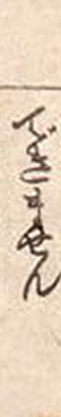できません
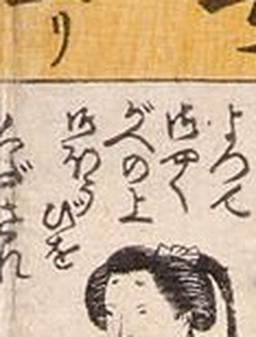がへの上
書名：奥奉公出世双六
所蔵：東京学芸大学教育コンテンツアーカイブ
